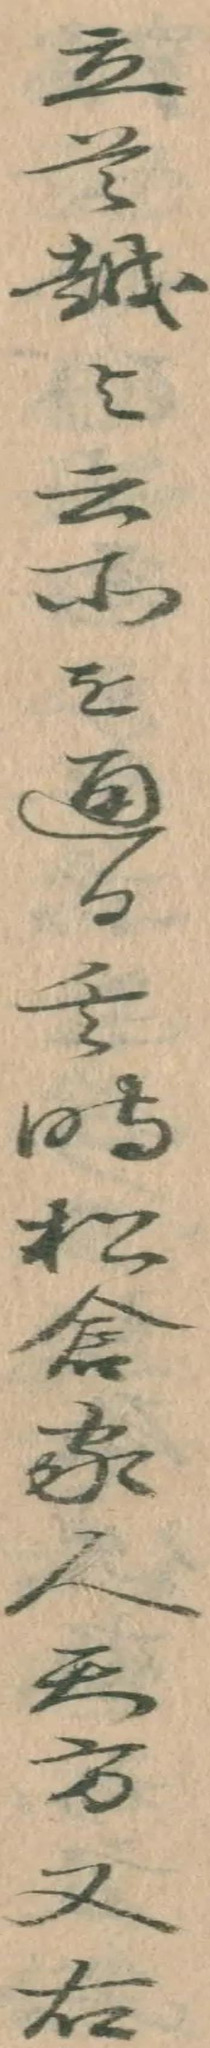立首越与云所を通る其時松倉家人天方又右
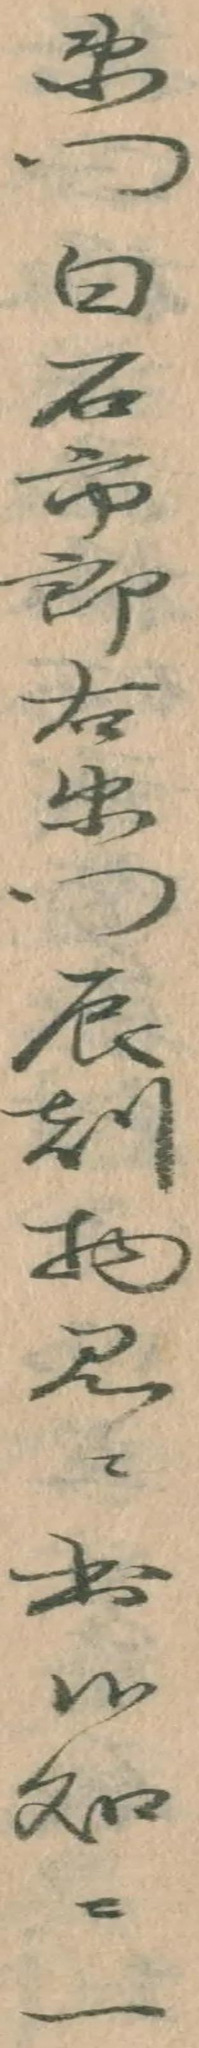衛門白石市郎右衛門辰刻物見に出候処に一
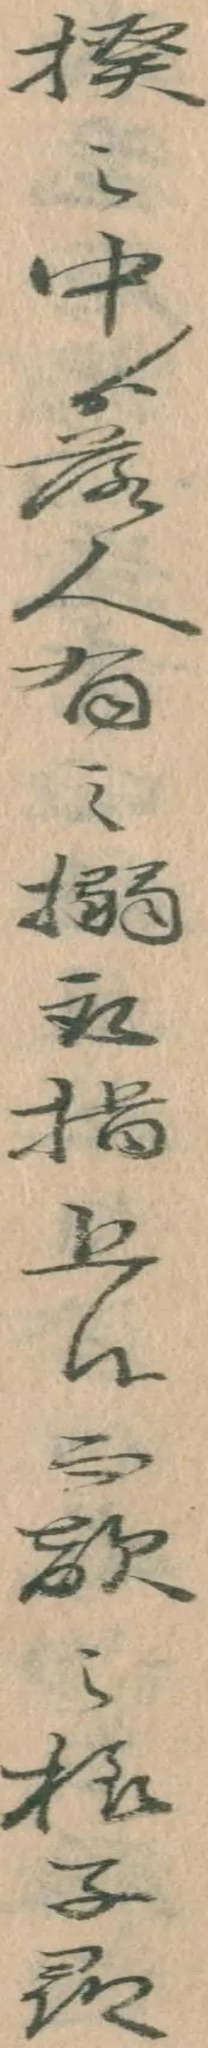揆之中ゟ落人有之搦取指上候而敵之様子尋
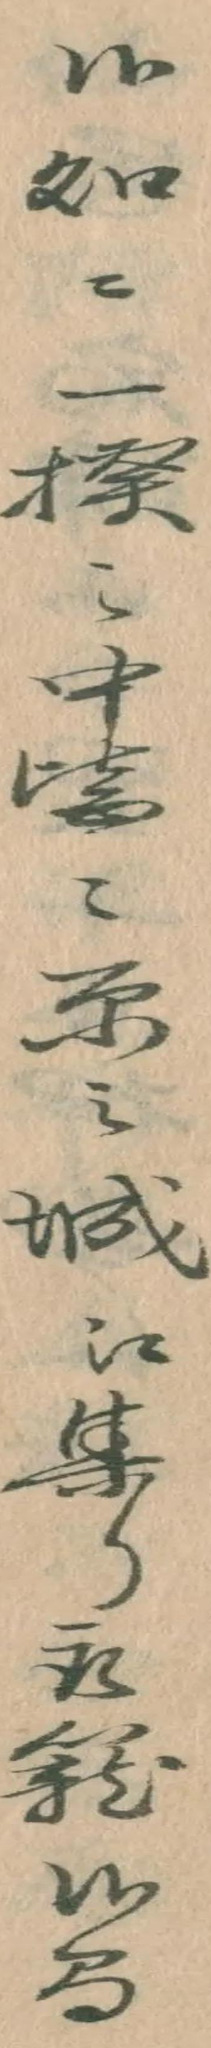候処に一揆之中皆々原之城江集り取籠候間
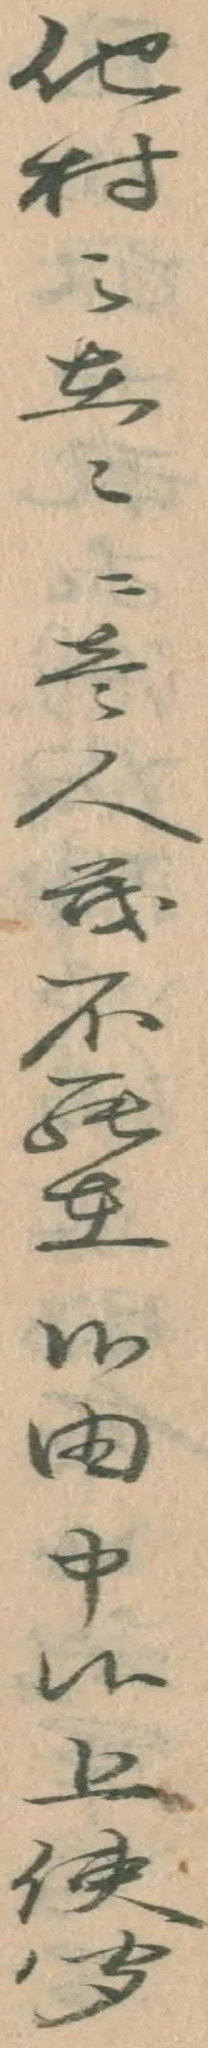他村之在々に壱人茂不罷在候由申候上使聞
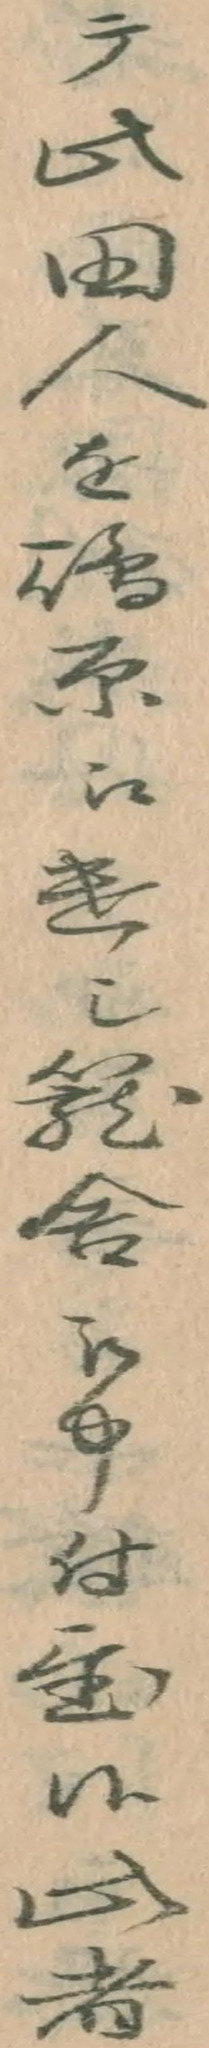て此由人を島原江遣し籠舎被申付置候此者

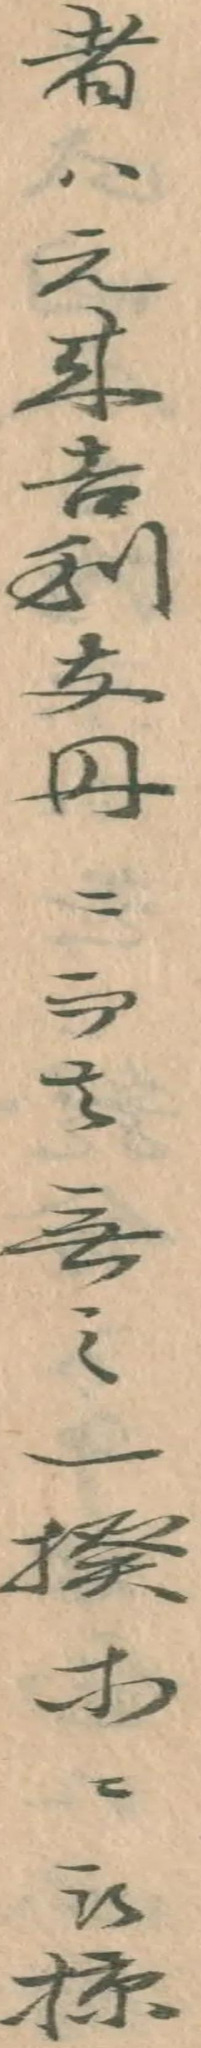者は元来吉利支丹に而者無之一揆等に被掠
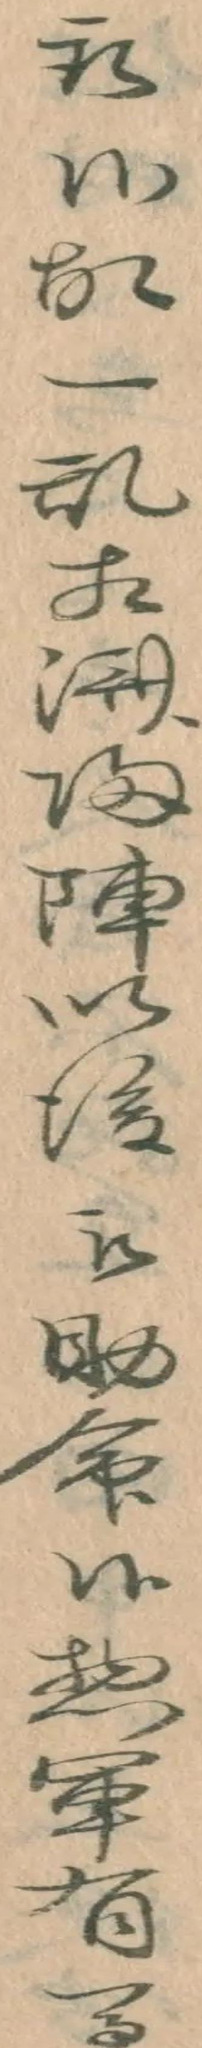取候故一乱相済帰陣以後被助命候惣軍有馬
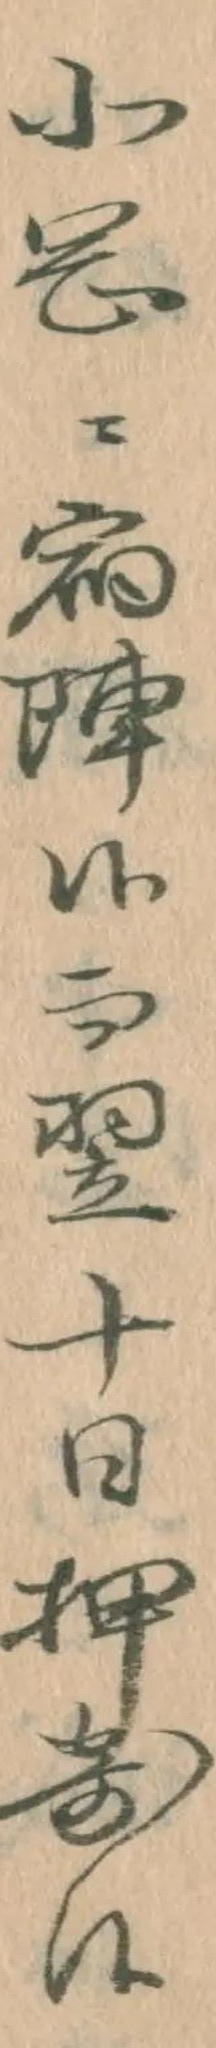北岡に宿陣候而翌十日押寄候
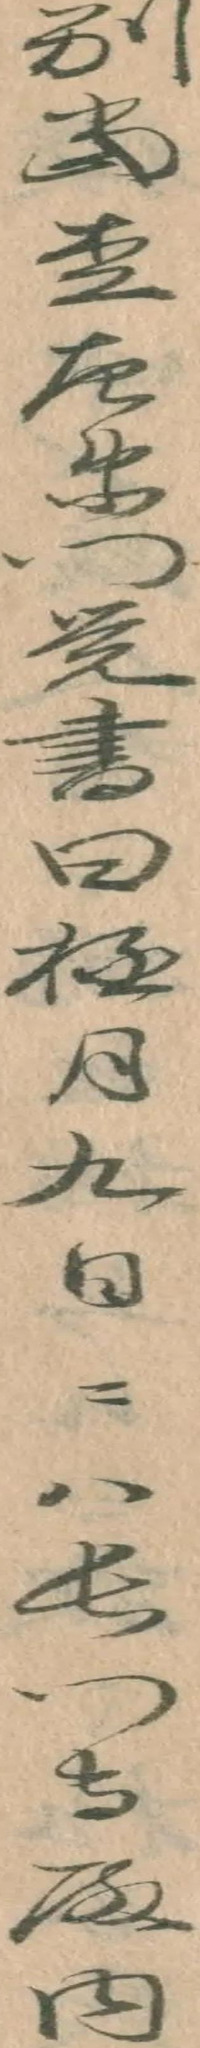別当杢左衛門覚書曰極月九日には長門守殿内
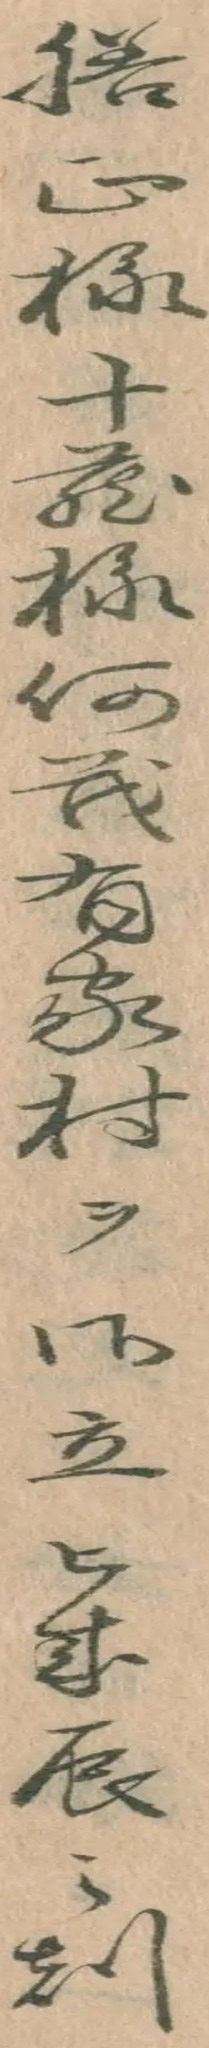膳正様十蔵様何茂有家村を御立被成辰之刻
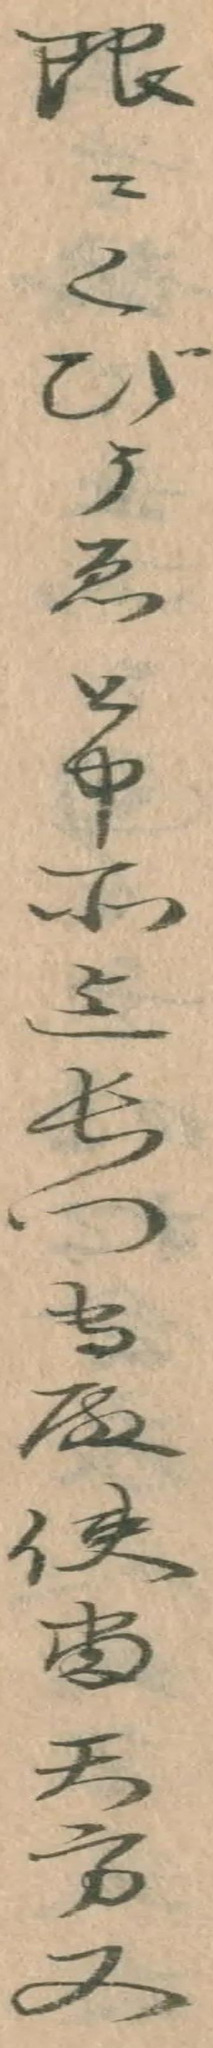限にくびうゑと申所迄長門守殿使番天方又
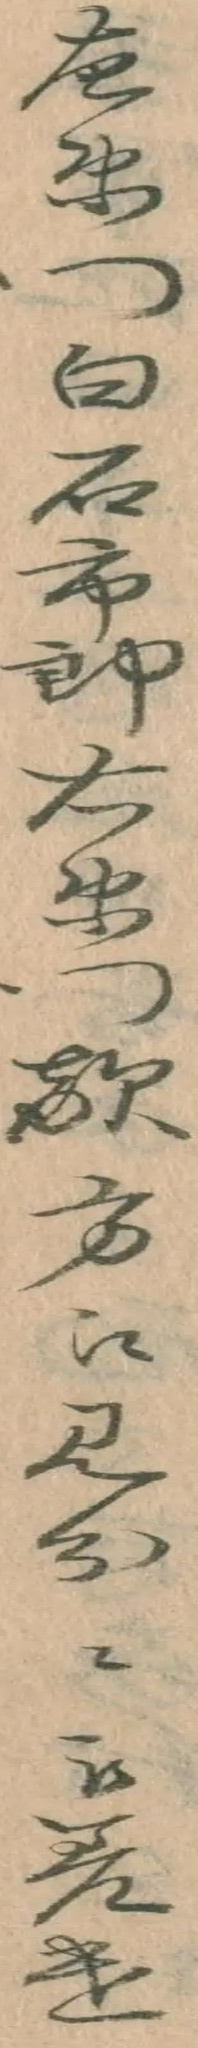左衛門白石市郎右衛門敵方江見分に被差遣
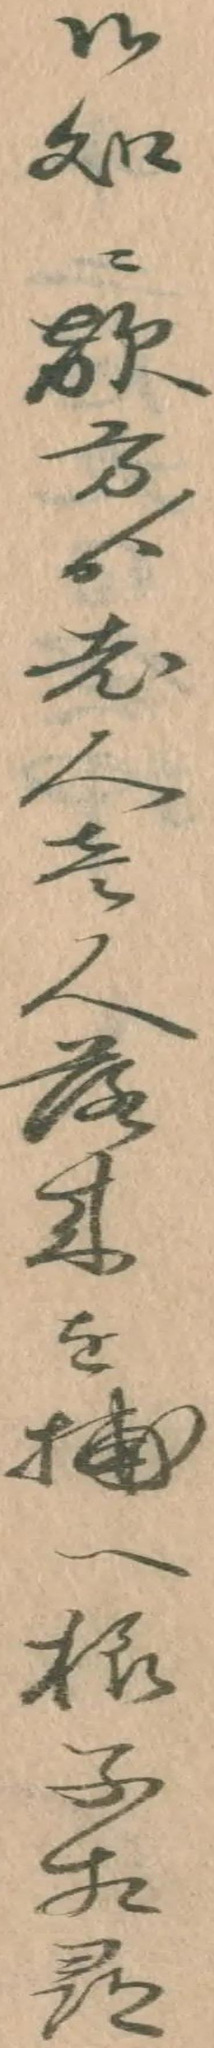候処に敵方ゟ老人壱人落来を捕へ様子相尋
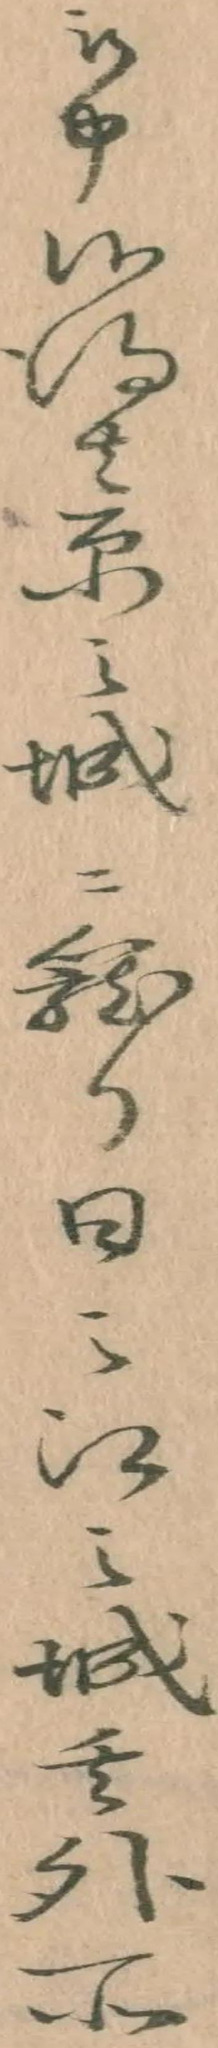被申候得者原之城に籠り日之江之城其外所
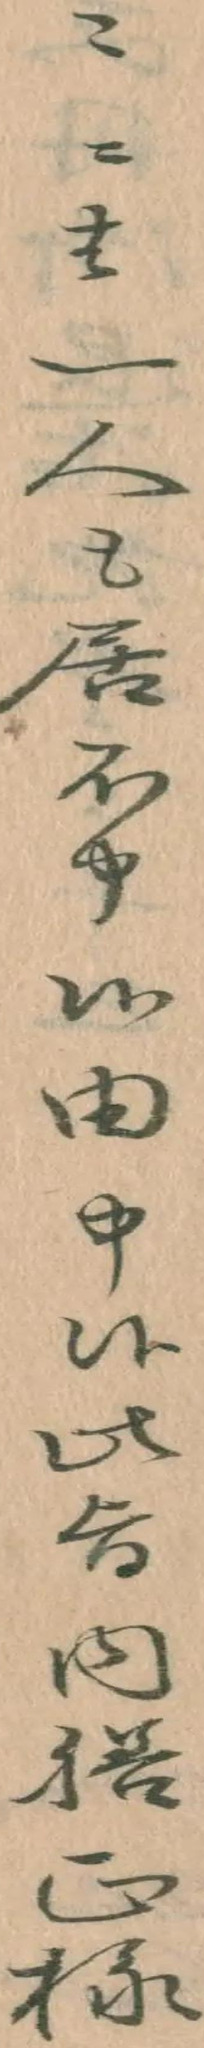々に者一人も居不申候由申候此旨内膳正様
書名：切支丹御退治記 49巻. [4]
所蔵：国立国会図書館 National Diet Library, JAPAN
